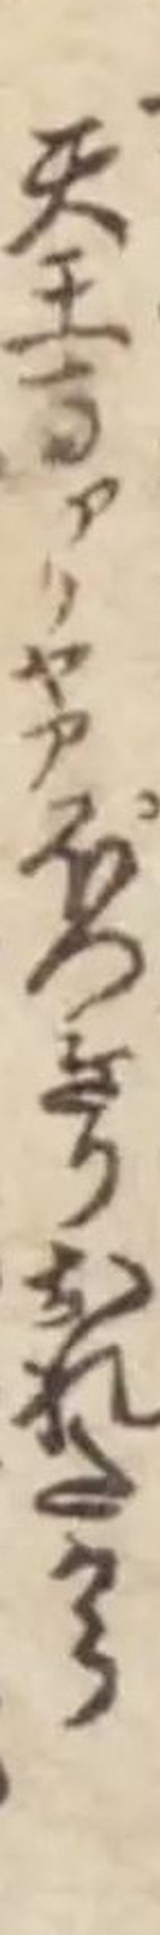天王寺アリヤアぽつきりおれたから
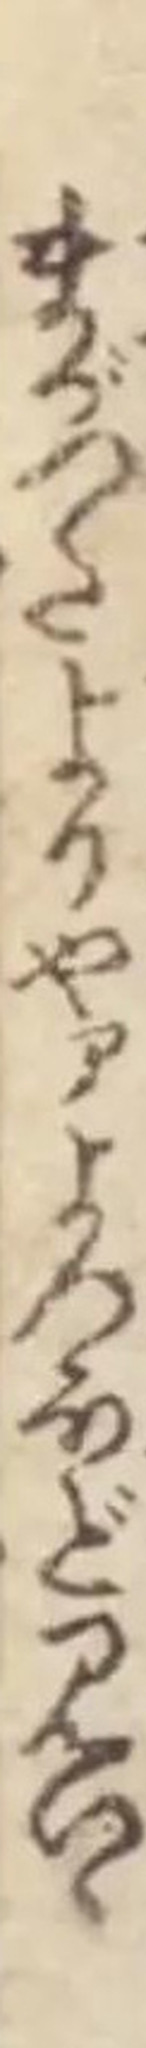まがつたよりやアよつほど見いゝ
